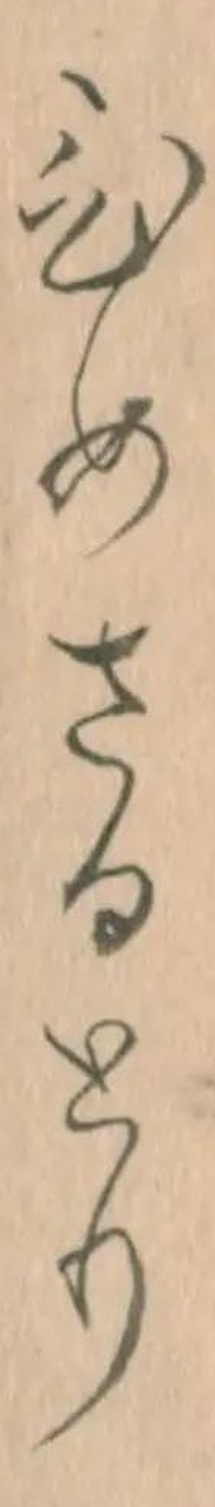ひめさるとり
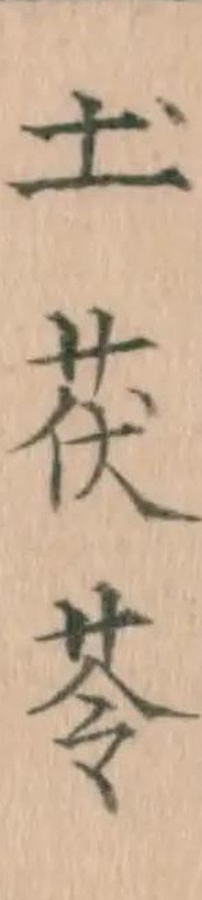土茯苓
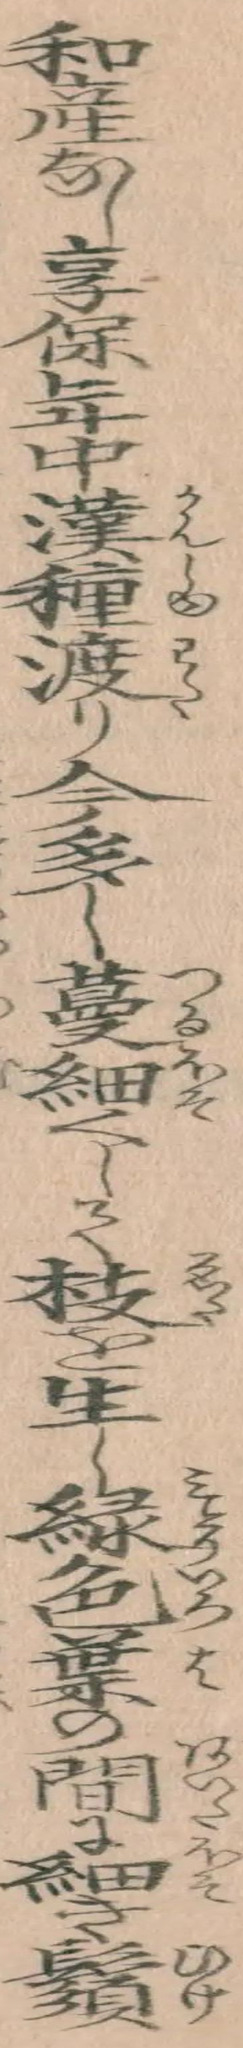和産なし享保年中漢種渡り今多し蔓細くして枝を生し緑色葉の間に細き鬚
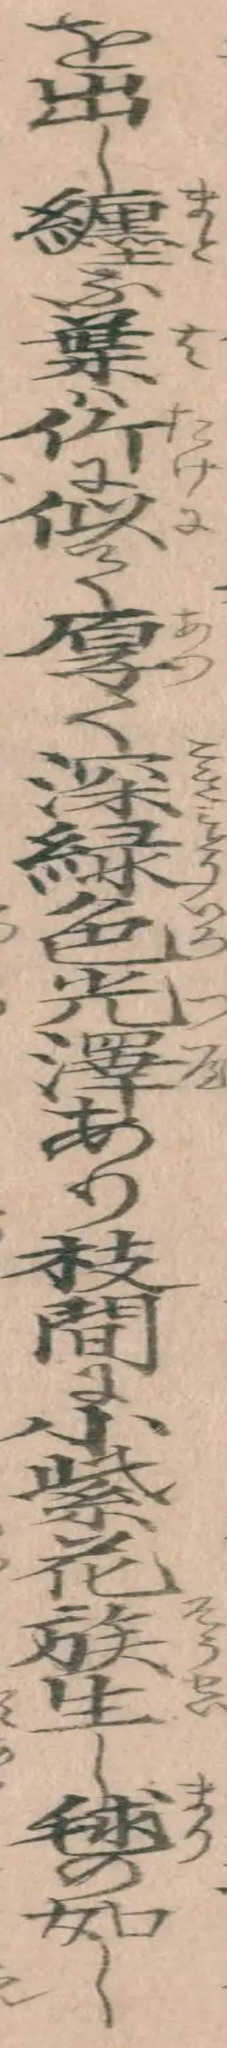を出し纏ふ葉は竹に似て厚く深緑色光沢あり枝間に小紫花族生し毬の如し
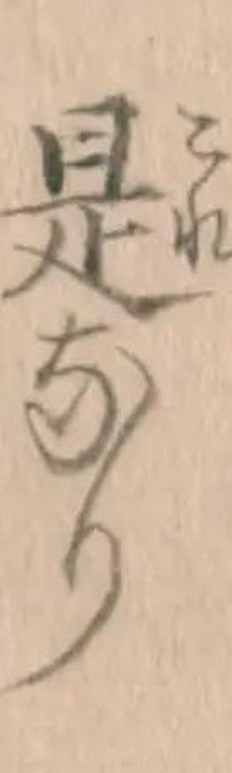是なり
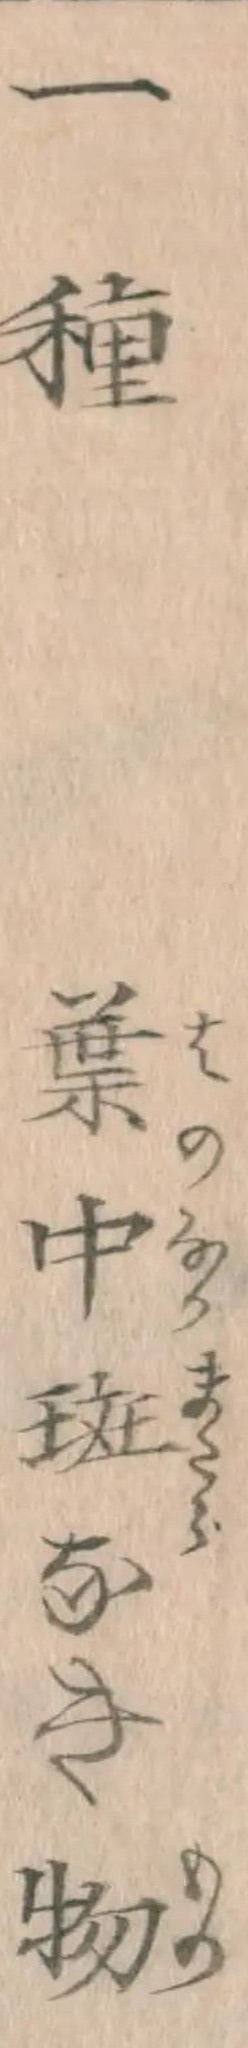一種葉中斑なき物

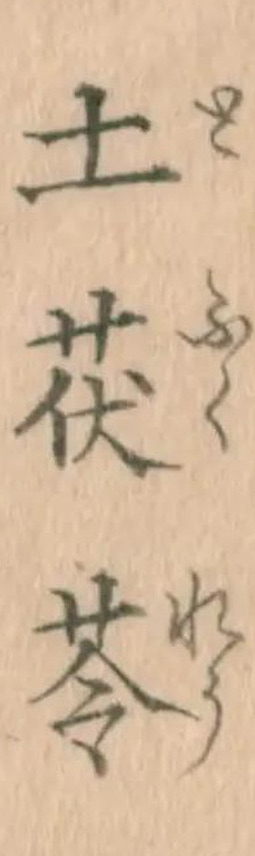土茯苓

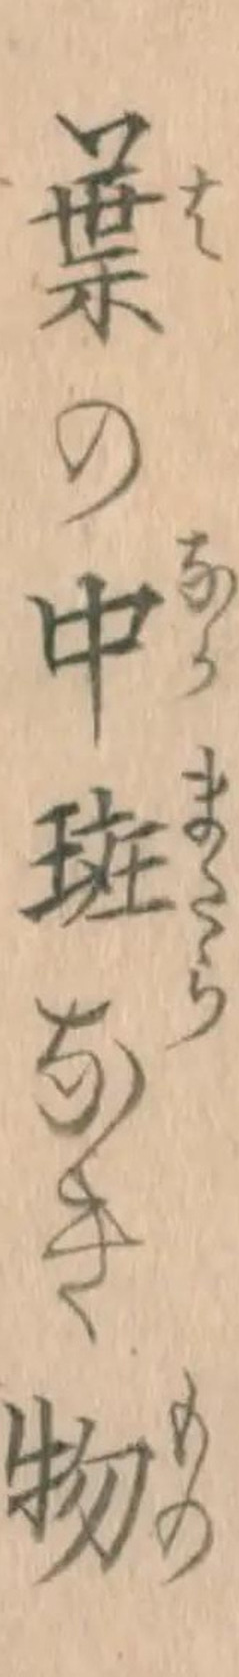葉の中斑なき物

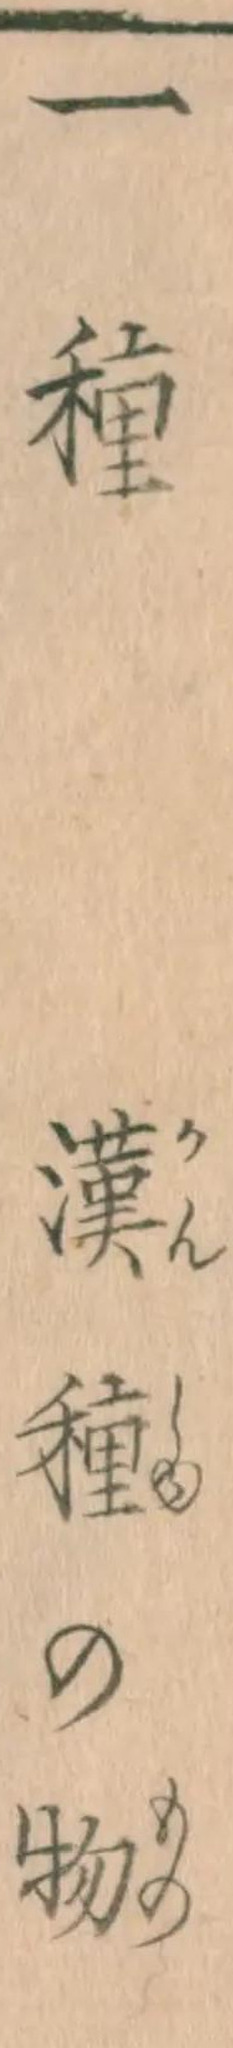一種漢種の物
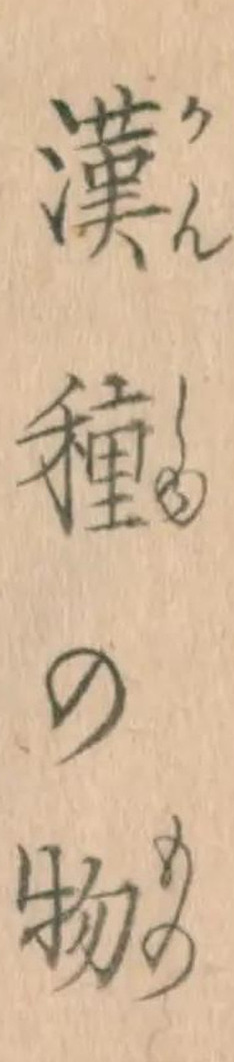漢種の物
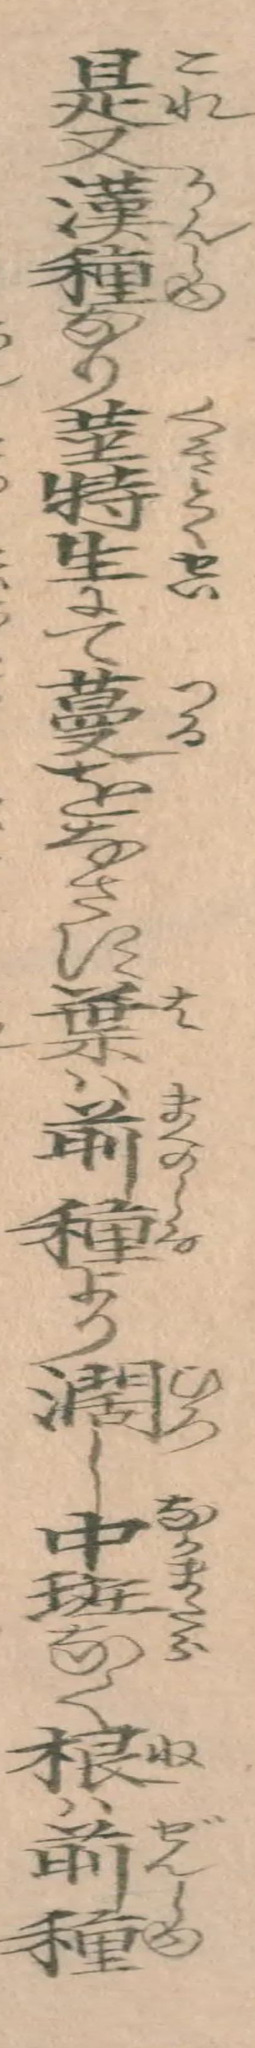是又漢種なり茎特生にて蔓をなさす葉は前種より闊し中斑なく根は前種
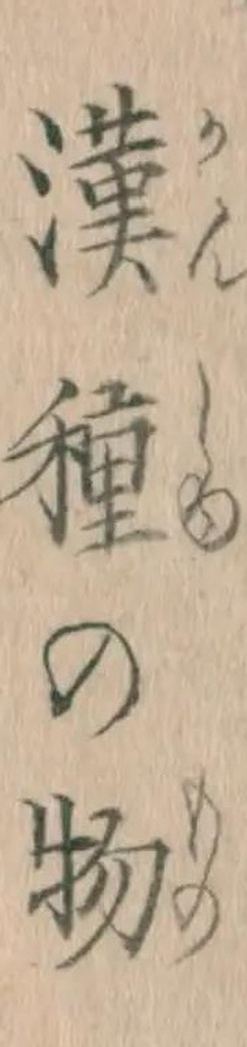漢種の物

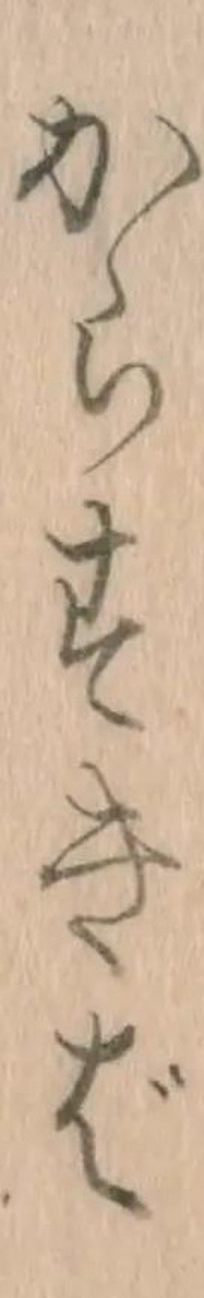からすきば
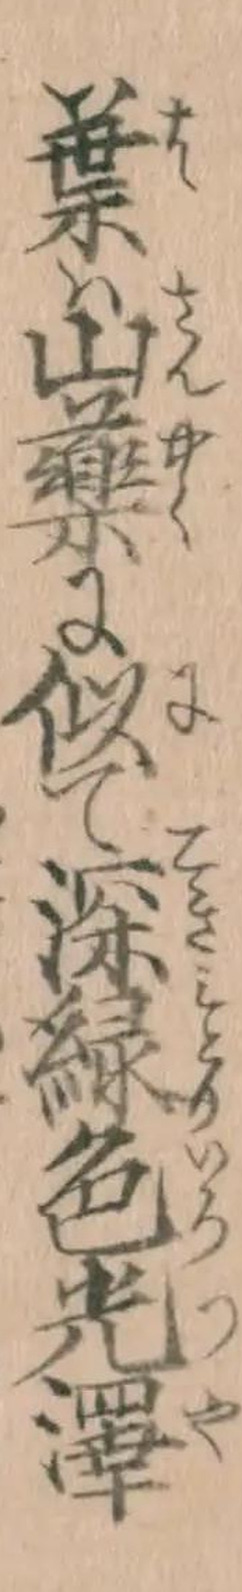葉は山薬に似て深緑色光沢
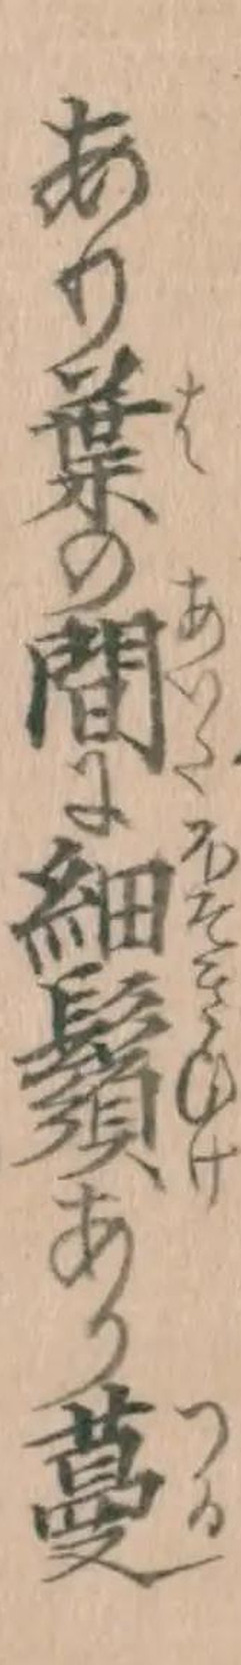あり葉の間に細鬚あり蔓
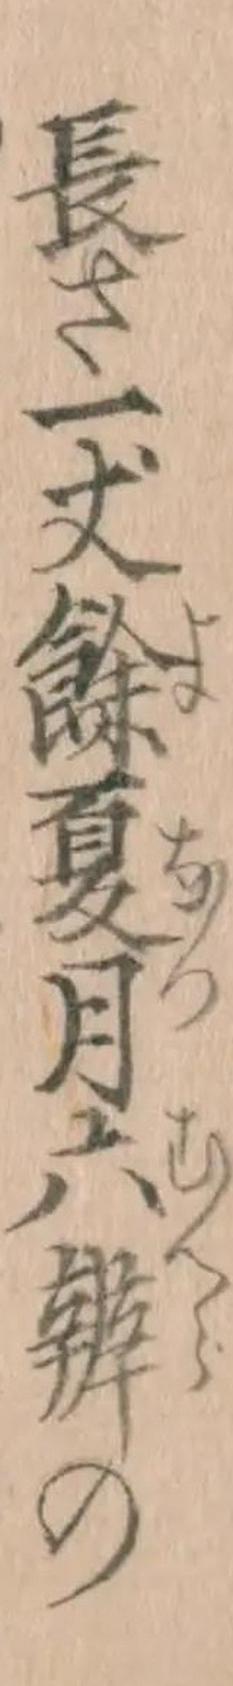長さ一丈余夏月六弁の
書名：本草図譜. 巻28-30
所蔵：国立国会図書館 National Diet Library, JAPAN
